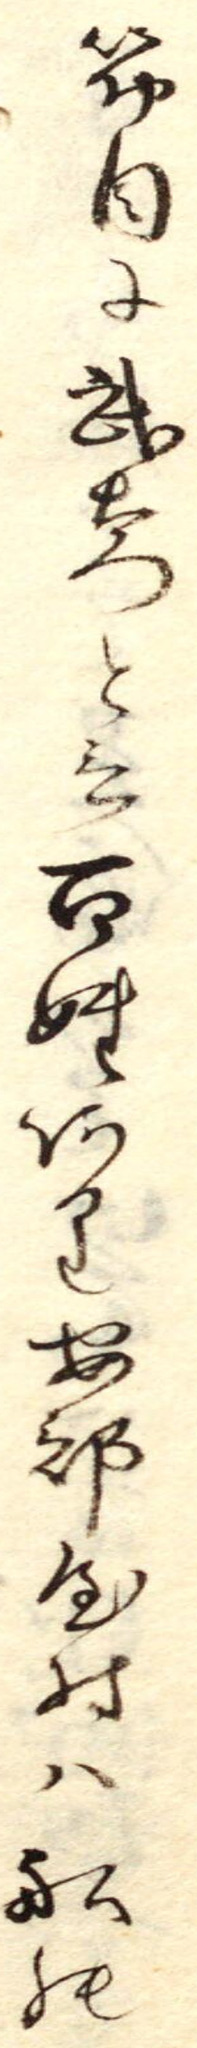筋目に武右衛門と云百姓あり安部屋村は船の
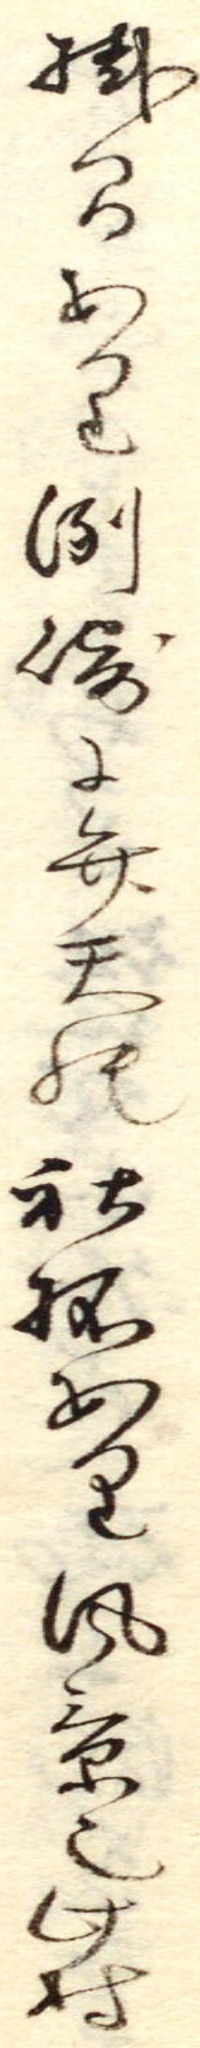掛間あり例崎に弁天の社抔あり風景也此村
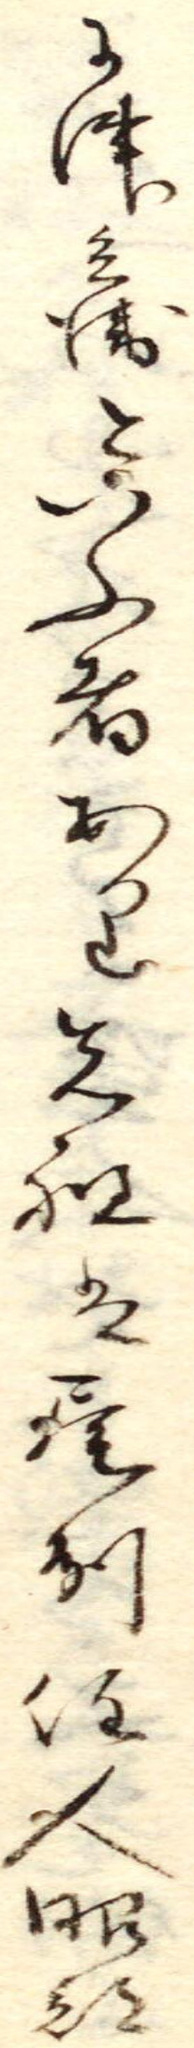に津兵衛といふ者あり先祖は尾州住人服部
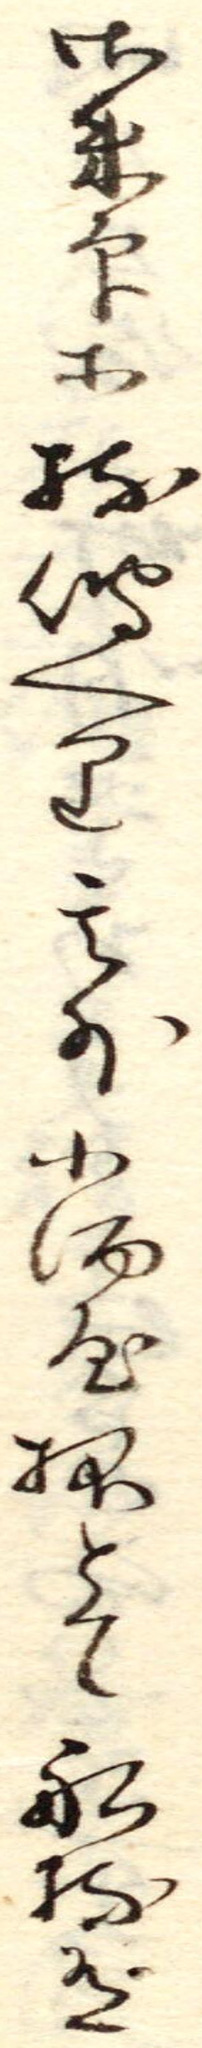御朱印等持伝へり其外小酒屋抔とて船持有
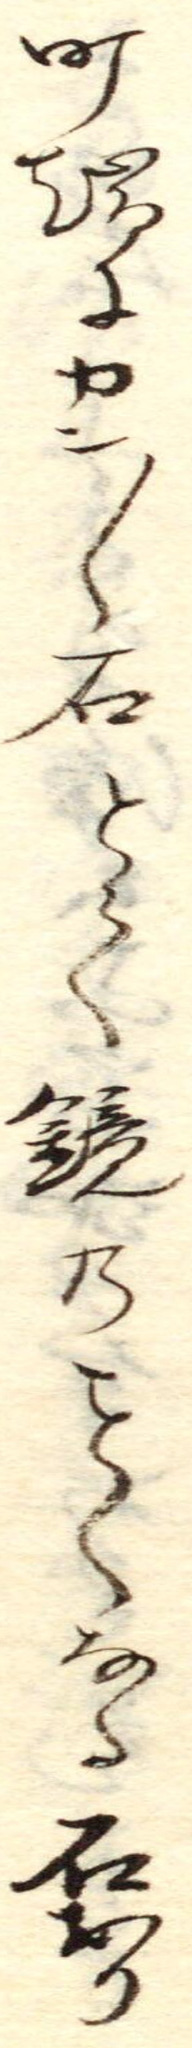町端にカン〳〵石とて鏡のことくなる石あり
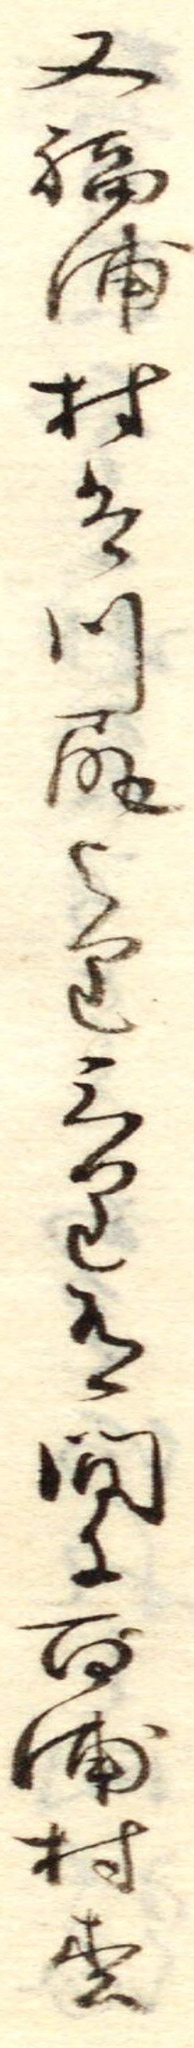又福浦村は川尻より三里有間に百浦村枩
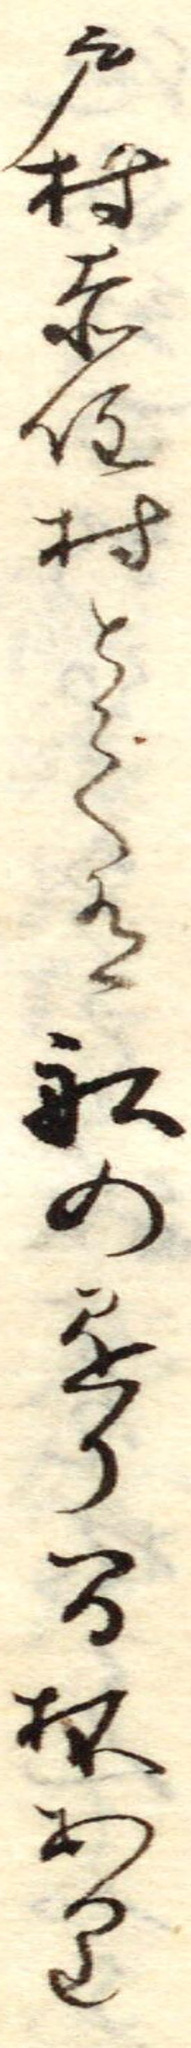戸村赤住村とて有船の懸り間抔あり

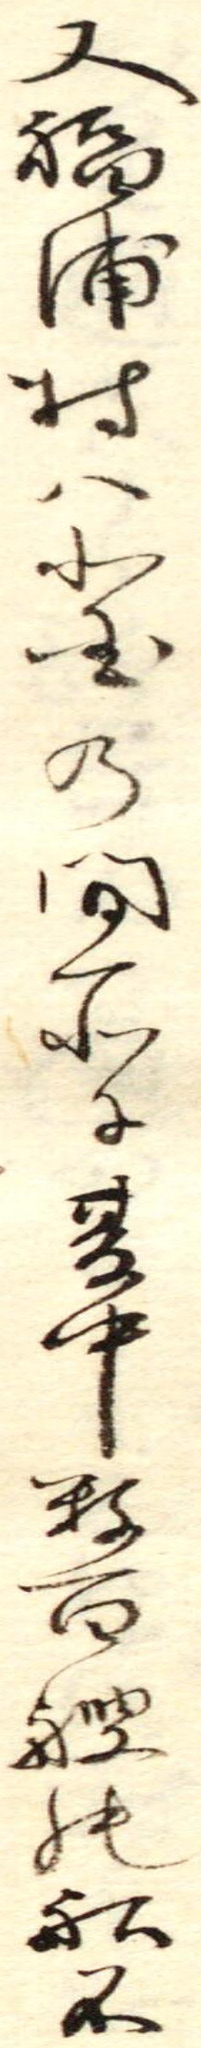又福浦村は北国の間所に夏中数百艘の船不
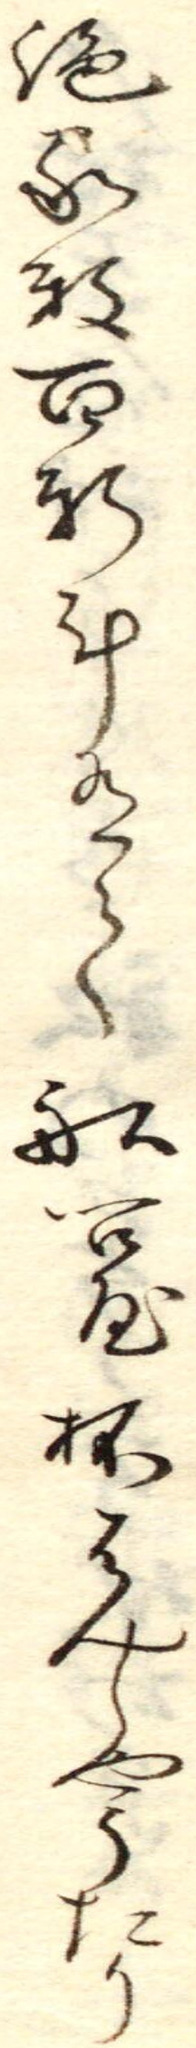絶家数百軒計有て船問屋抔はんしやうたり
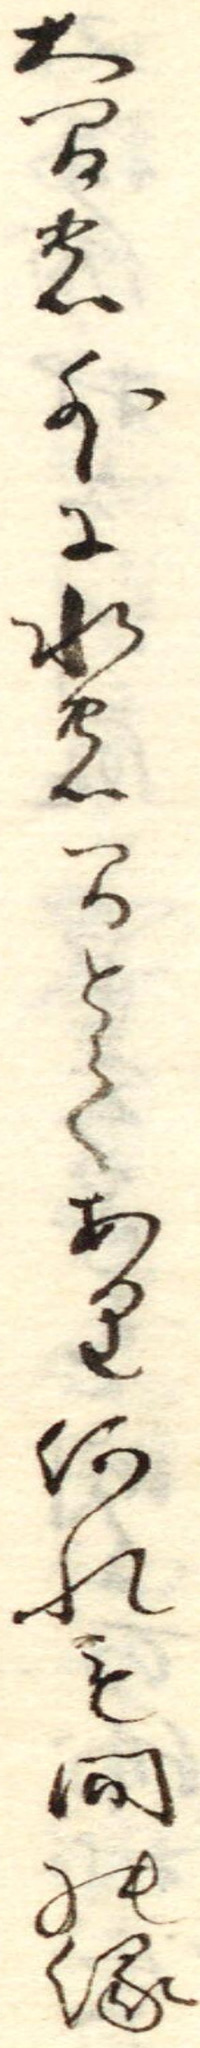大間の外に水の間とてあり何れも間の縁
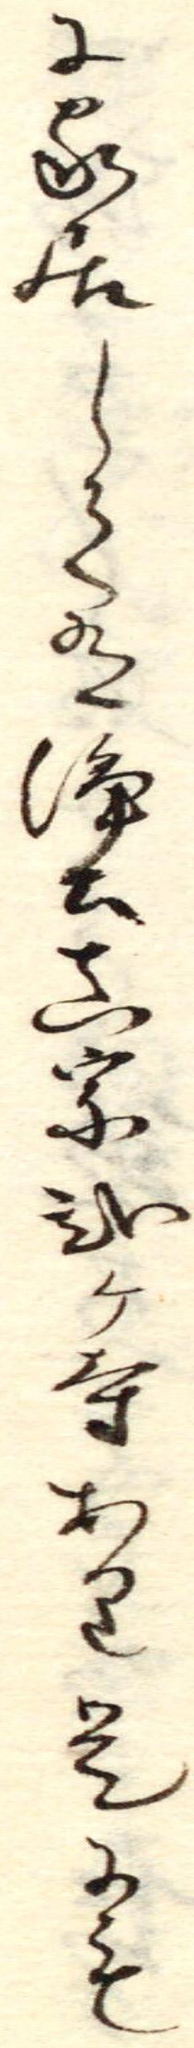に家居して有浄土真宗弐ヶ寺あり是にも
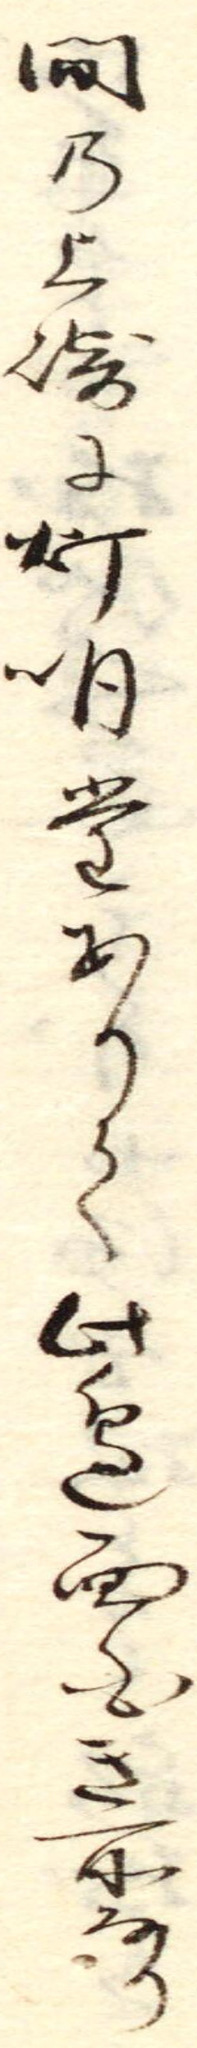間の上崎に灯明堂ありて此辺面白き所なり
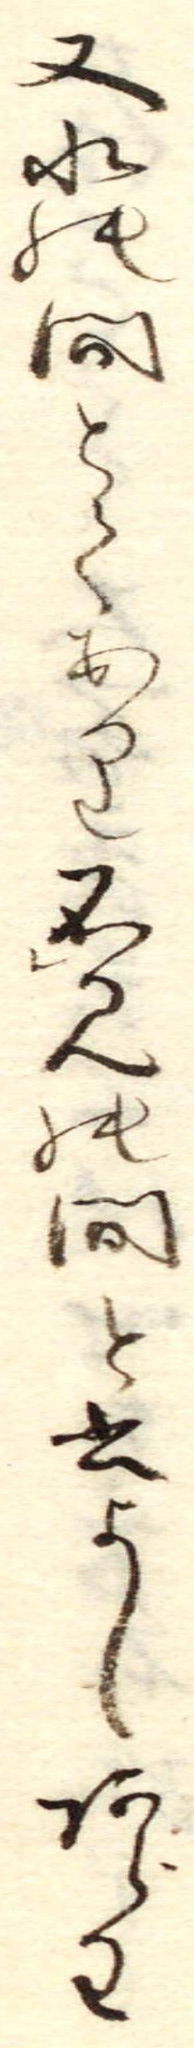又水の間とてあり不見の間と書よしあらわ
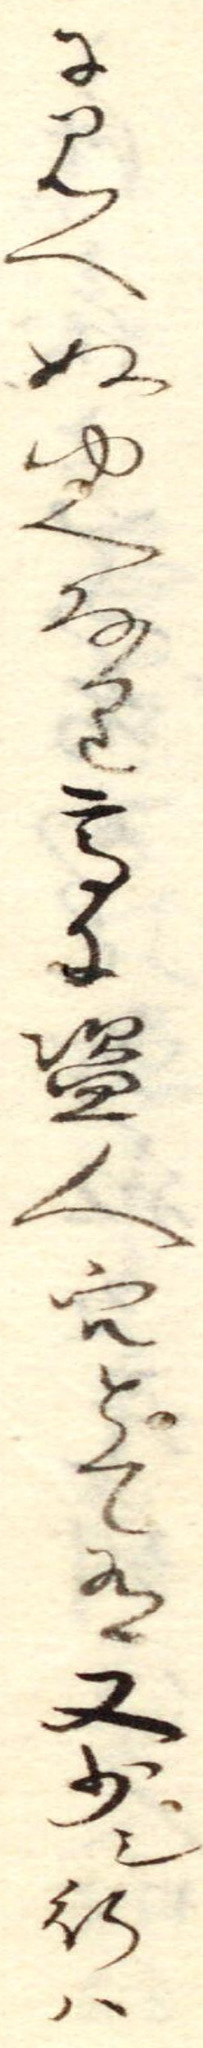に見へぬゆへなり高に盗人穴とて有又少し行は
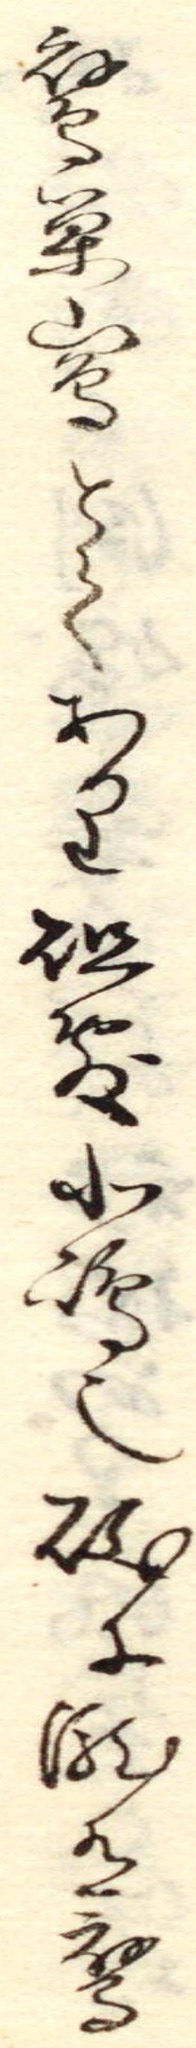鷹巣嶌とてあり岨敷小嶋也礒に瀧有鷹
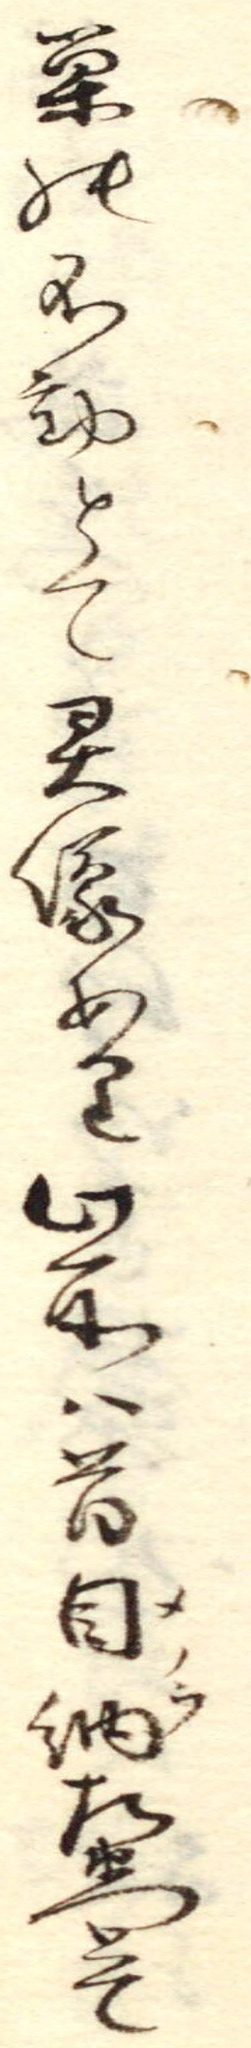巣の不動とて霊像あり此所は昔目納左衛門とて
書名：能登名跡誌
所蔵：Ishikawa Prefectural Library
